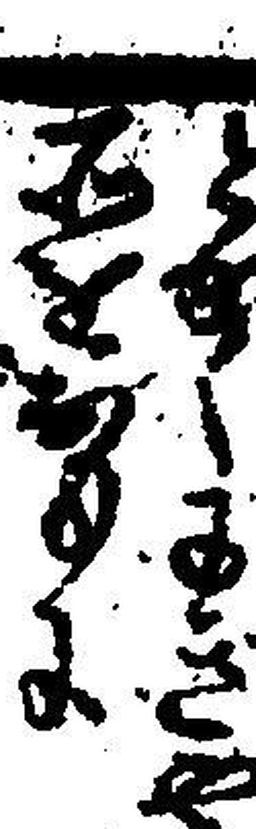所をおもに
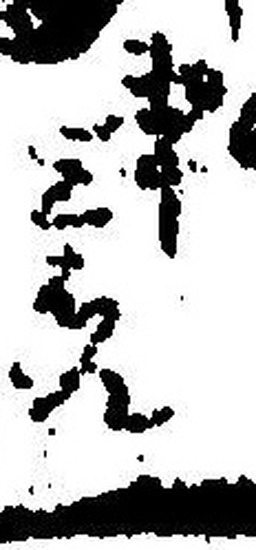三はん
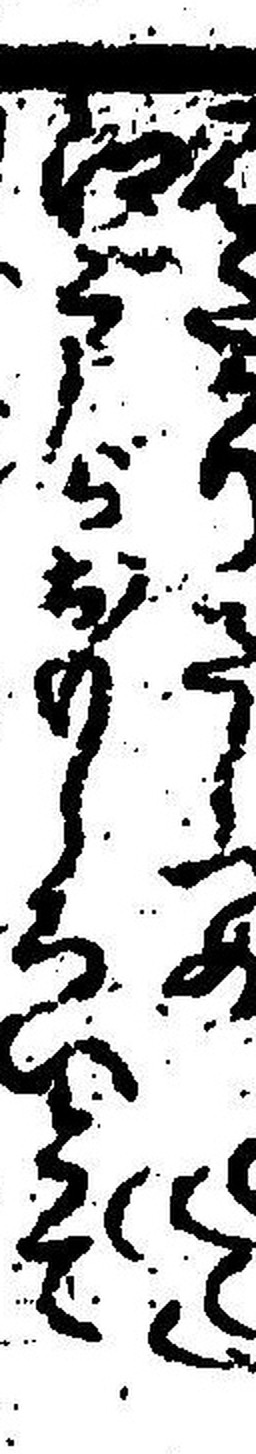江戸がおもしろいとて
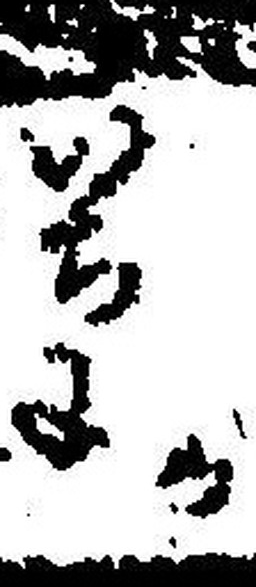いちに
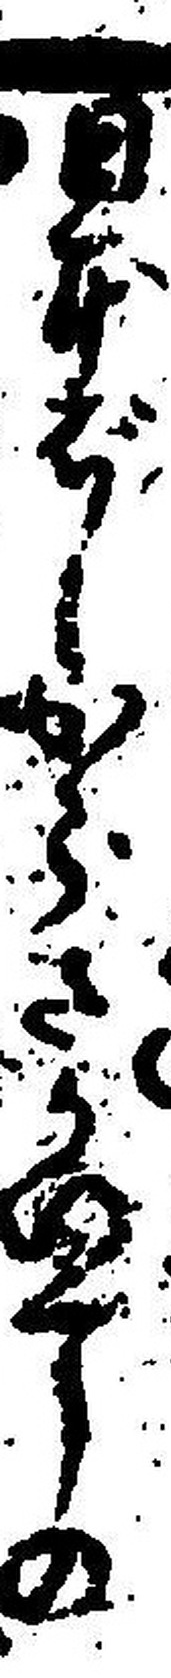日本ばしからさかい丁の
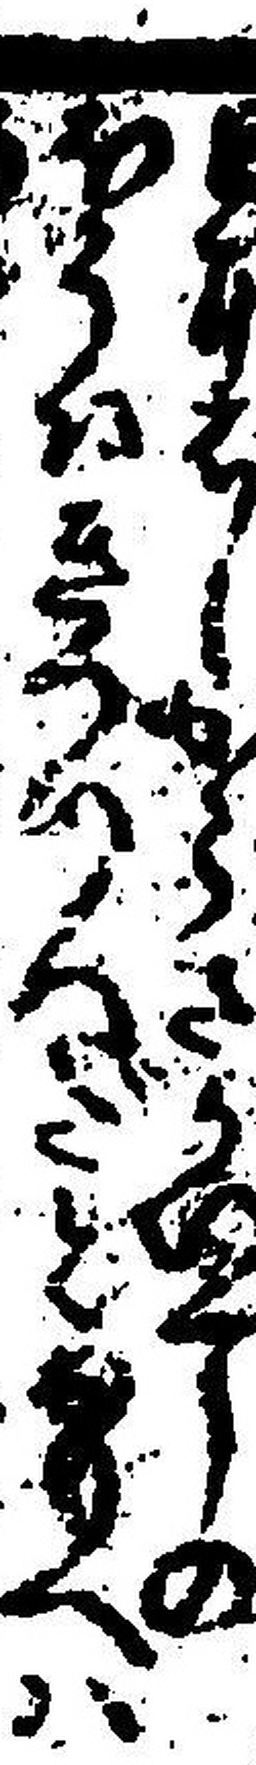ほうはきつい人だとおもへは
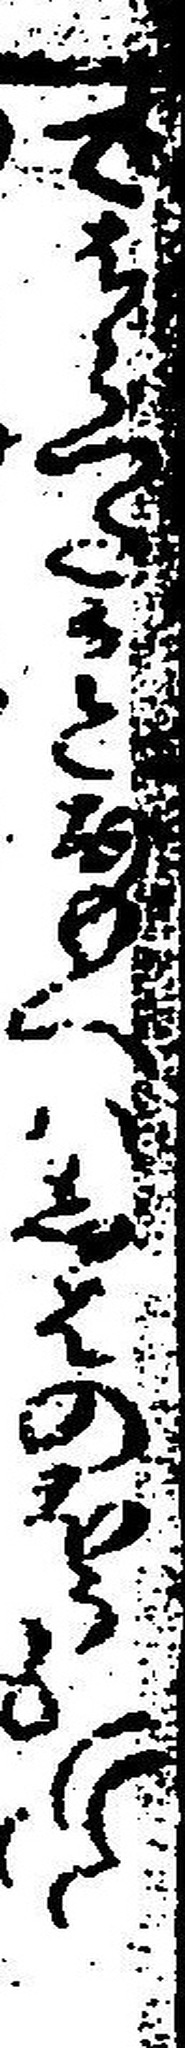ではらつたかとおもへはしはのほうも
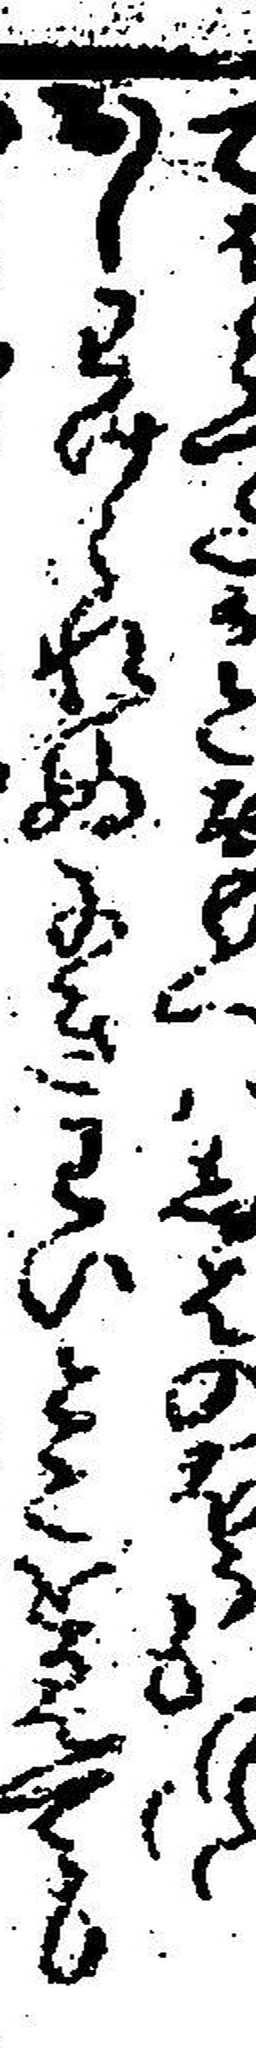おしわけられぬにきわいとこを見ても
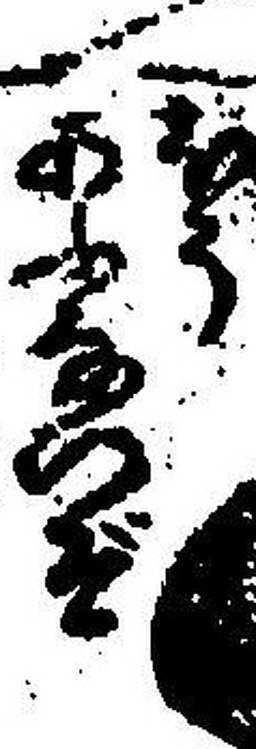あふないぞ
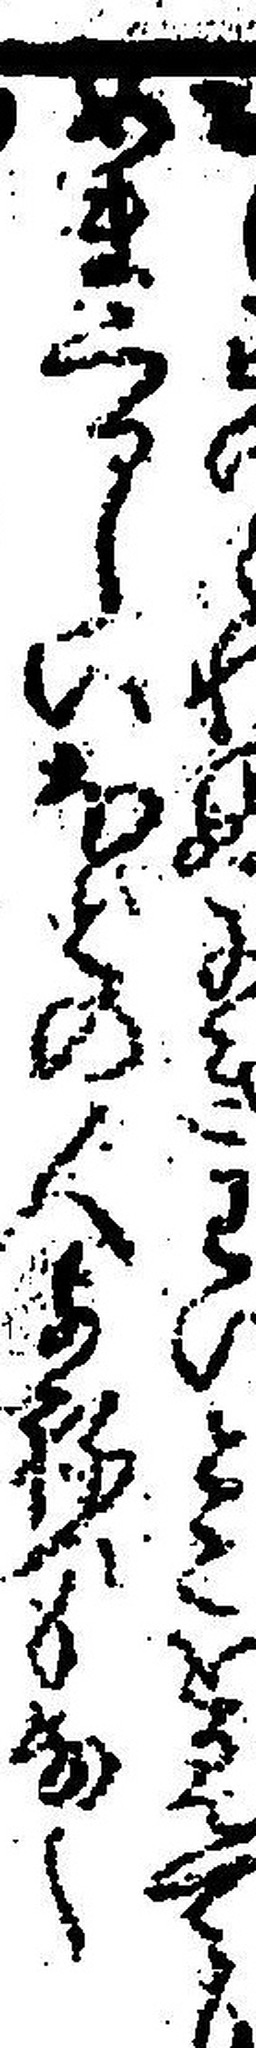めまくるしいほどの人よねんもなく
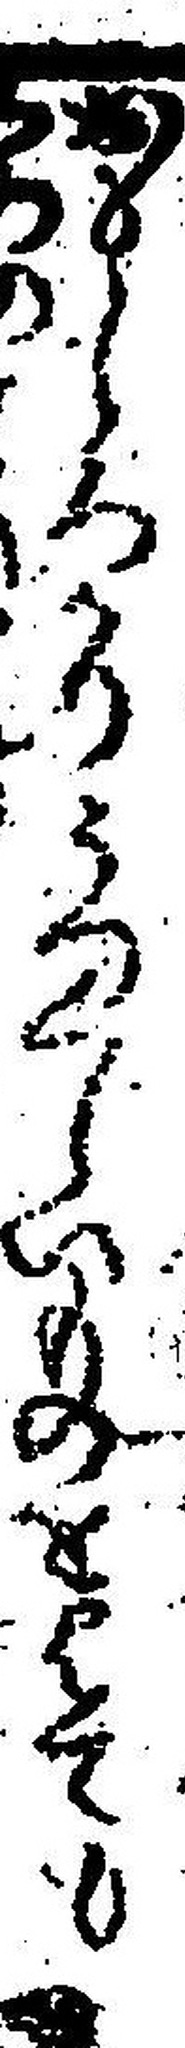おもしろかりうつくしいものを見ても
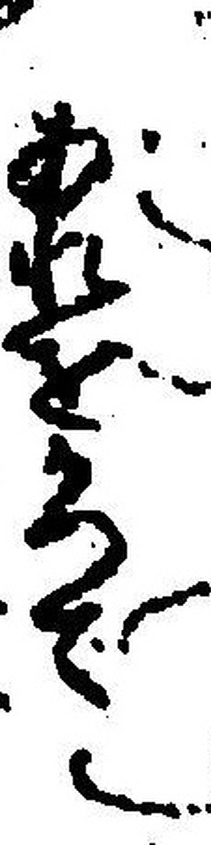あれをかつて
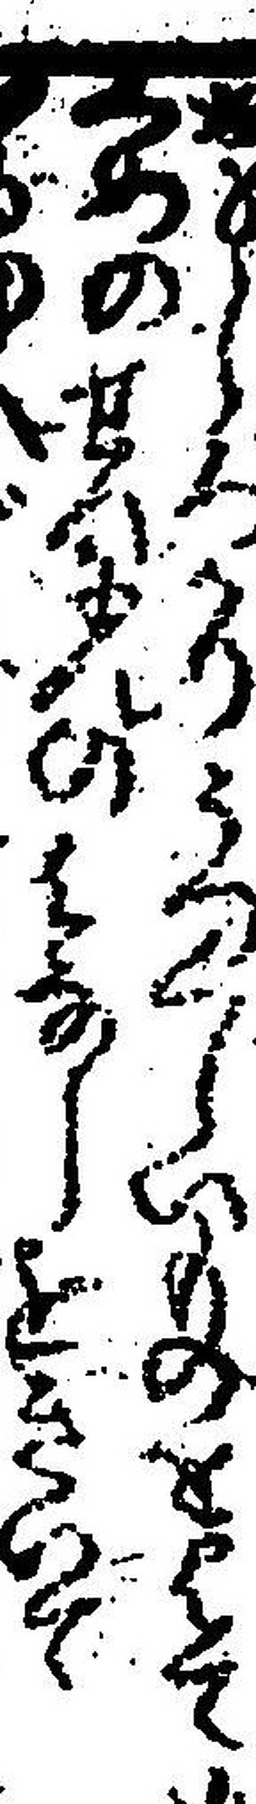くめのせんにんのはなしをきいて
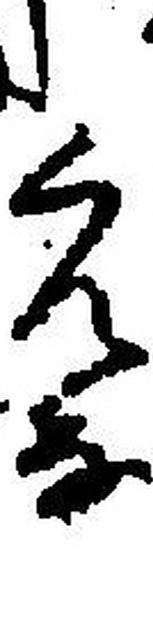くんな
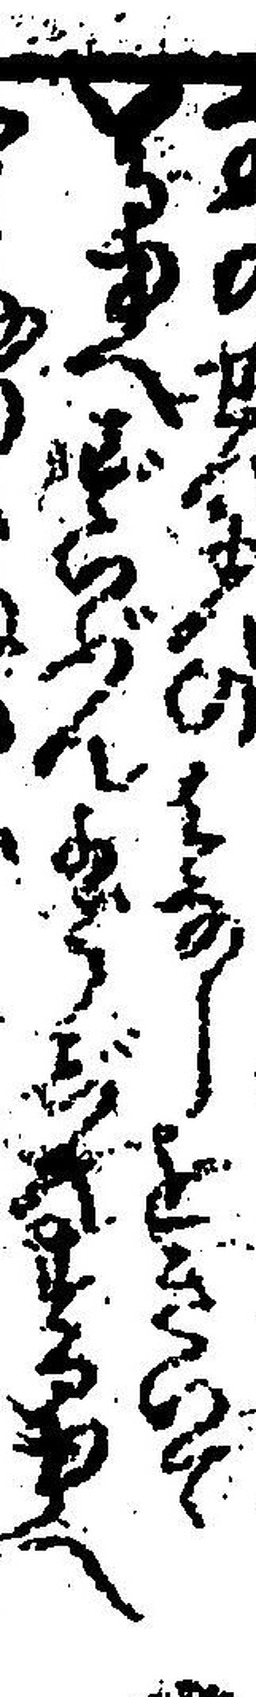いるゆへずいぶんようじんするゆへ
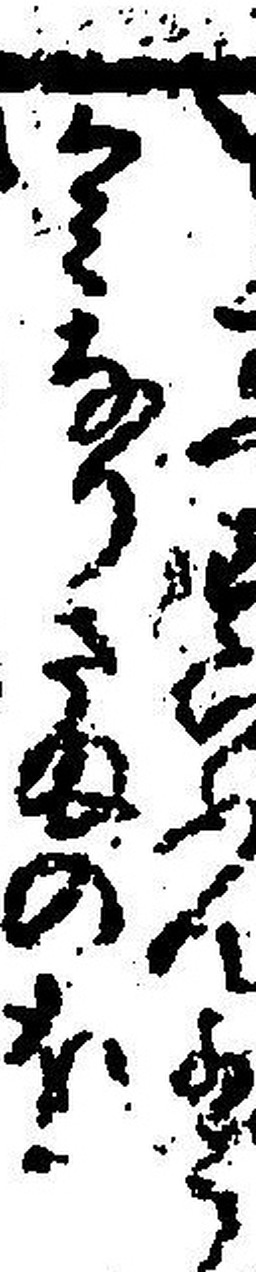かみなりさまのほ
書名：天竺儲之筋 / 市場通笑作
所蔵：東京大学総合図書館 General Library in the University of Tokyo, JAPAN
